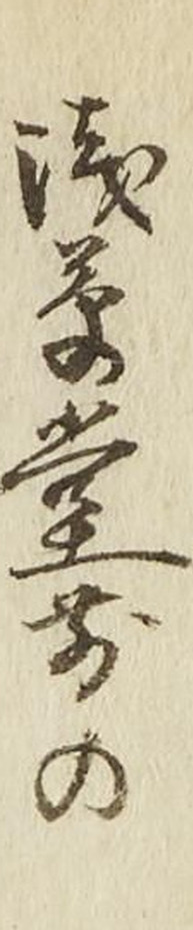浅草堂前の
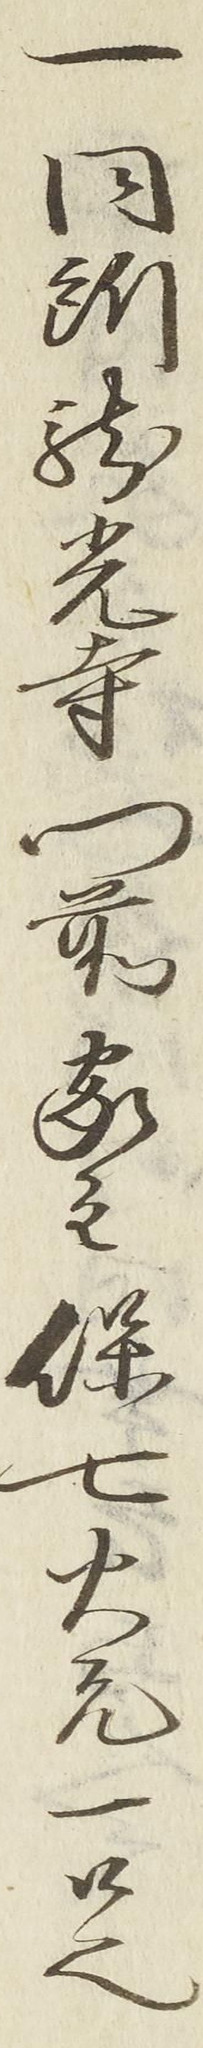一同所龍光寺門前家主保七火元一口也
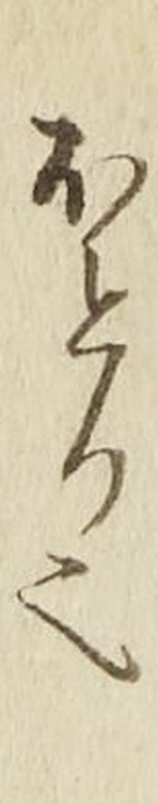ほとり也
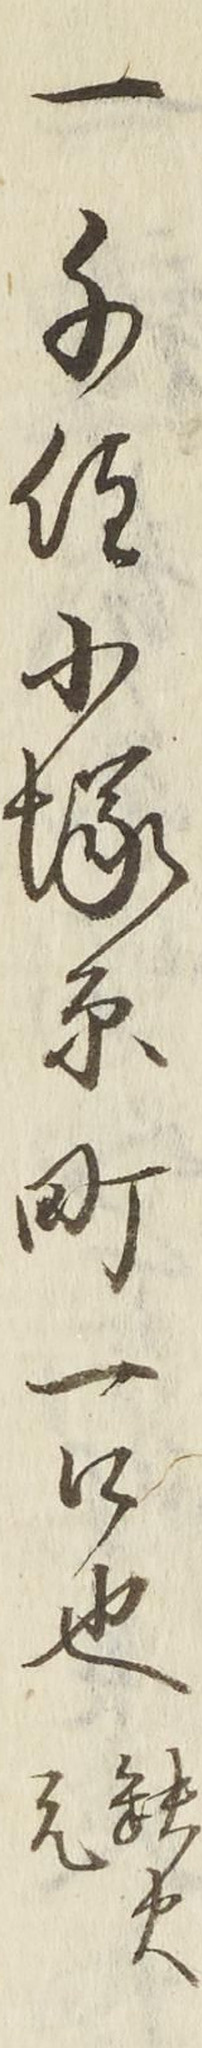一千住小塚原町一口也缺火元
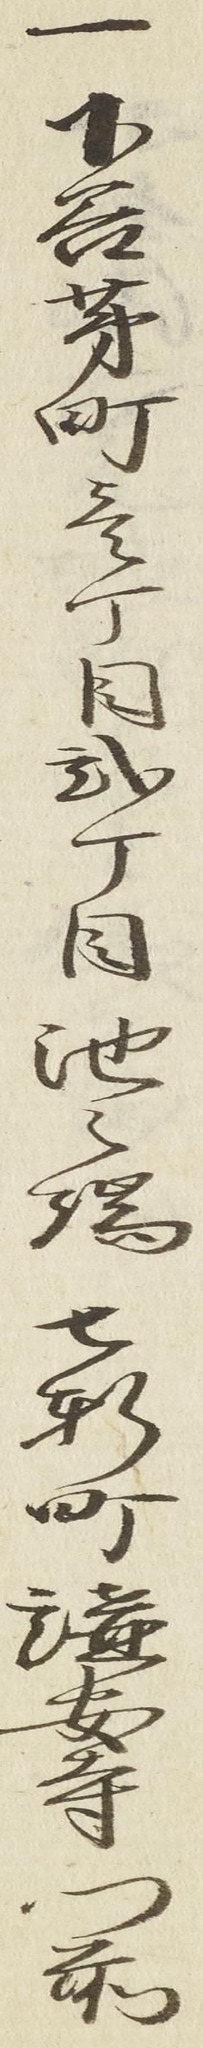一下谷茅町壱丁目弐丁目池之端七軒町講安寺門前
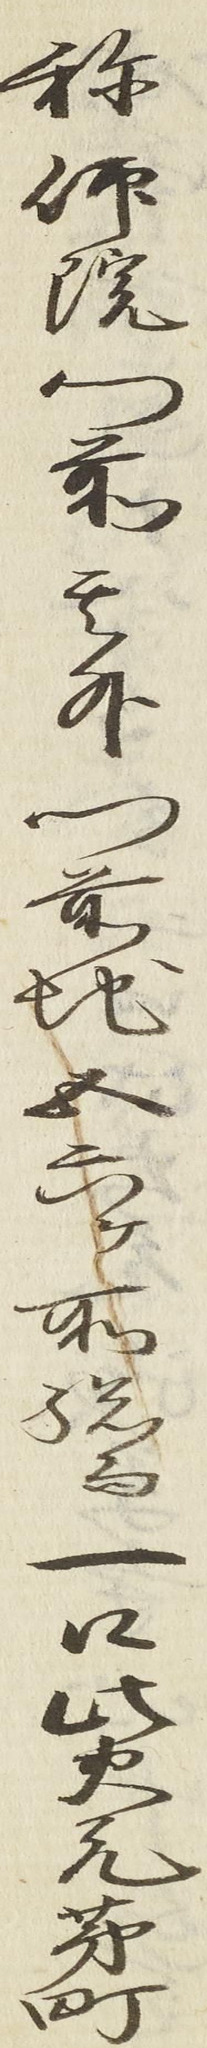称仰院門前其外門前地五六ケ所総て而一口此火元茅町
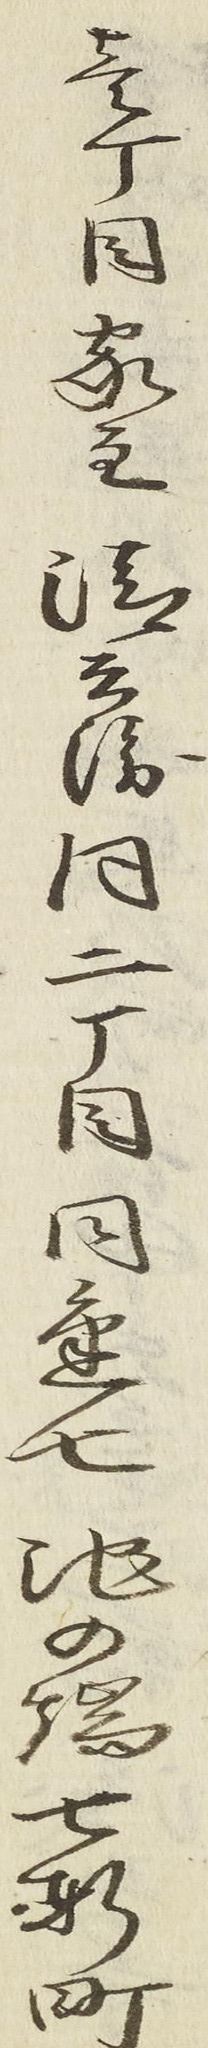壱丁目家主清兵衛同二丁目同金七池の端七軒町
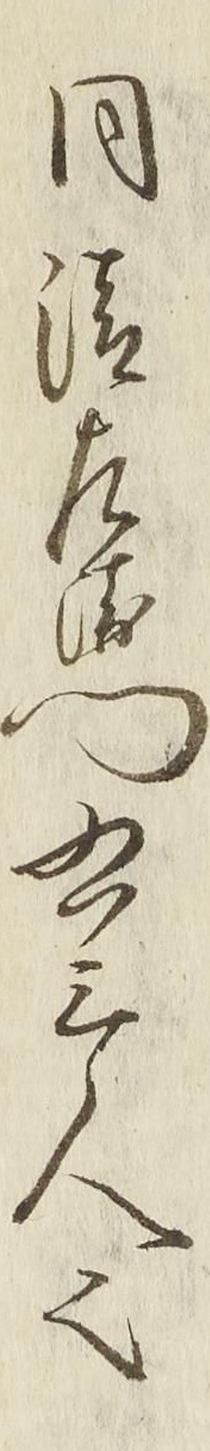同清左衛門右三人也
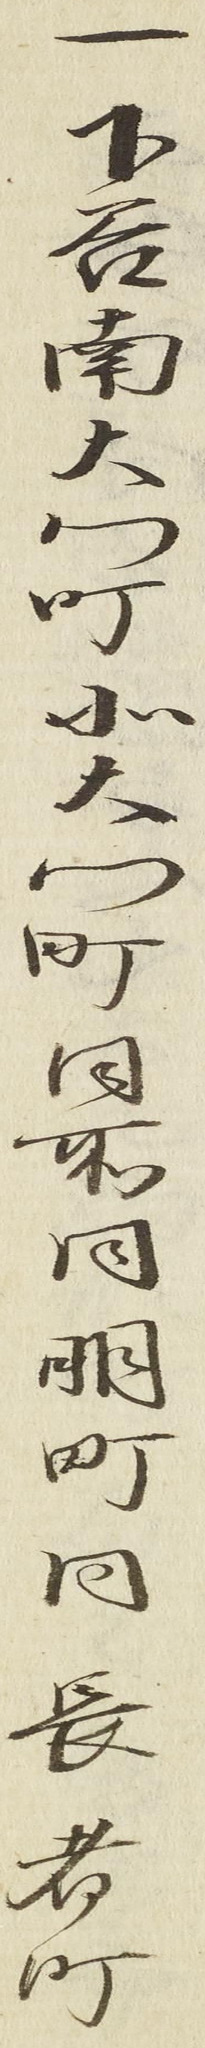一下谷南大門町北大門町同所同朋町同長者町
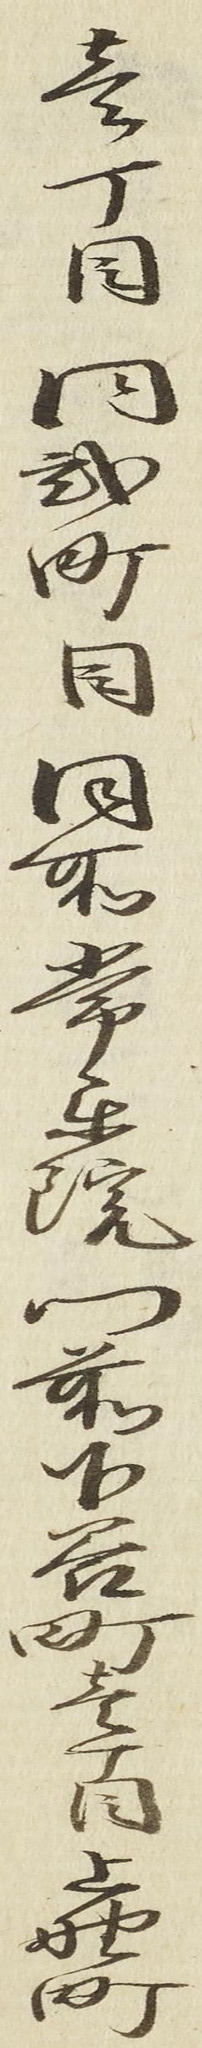壱丁目同弐丁目同所常楽院門前下谷町壱丁目上野町
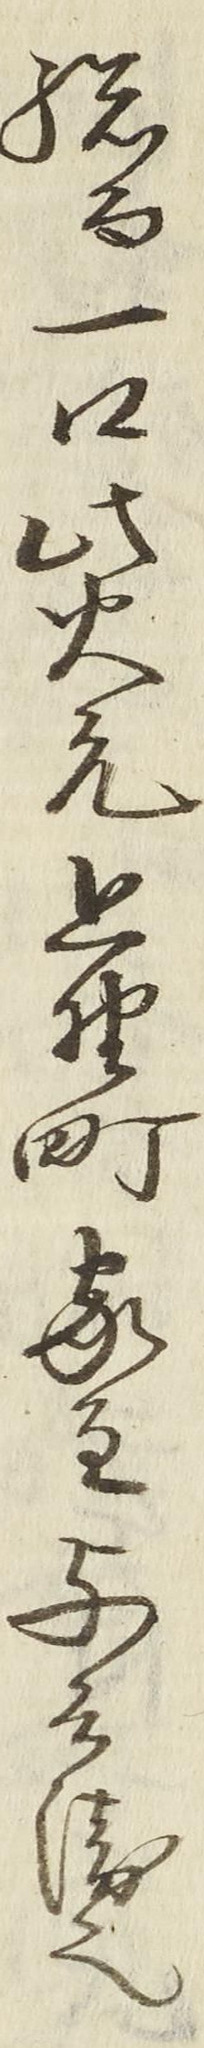総て而一口此火元上野町家主与兵衛也
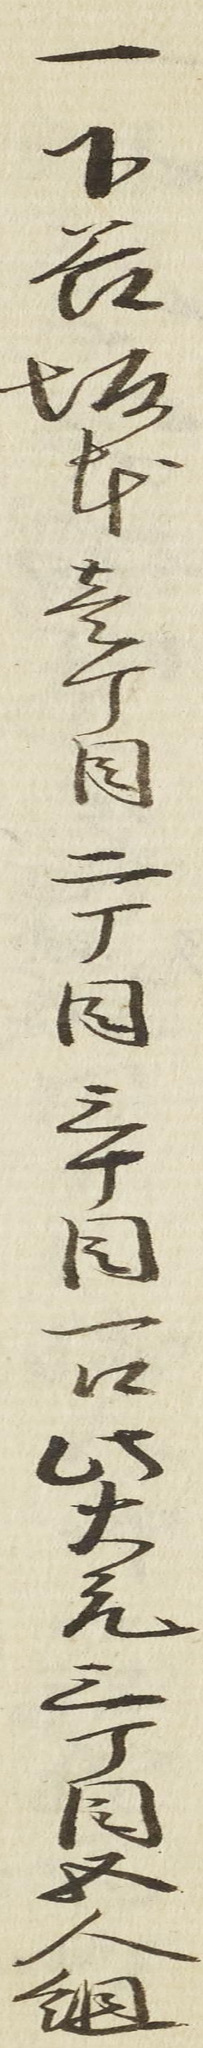一下谷坂本壱丁目二丁目三丁目一口此火元三丁目五人組
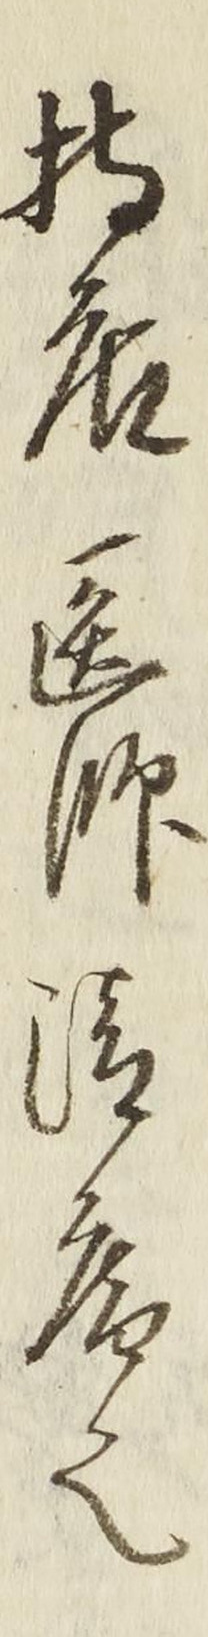持店医師清庵也
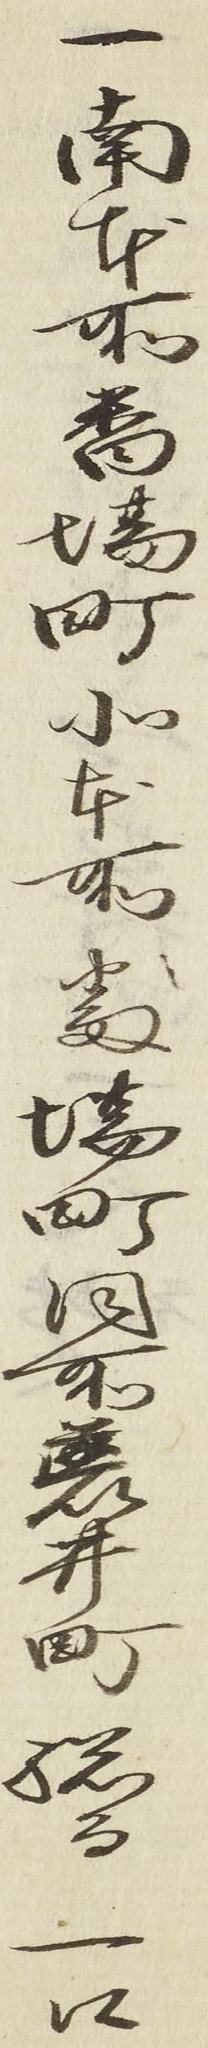一南本所番場町北本所番場町同所荒井町総て而一口
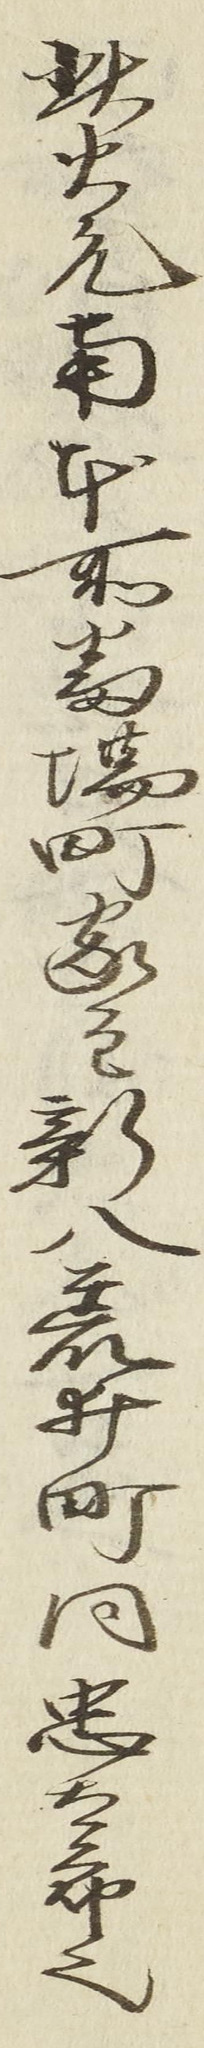此火元南本所番場町家主新八荒井町同忠太郎也
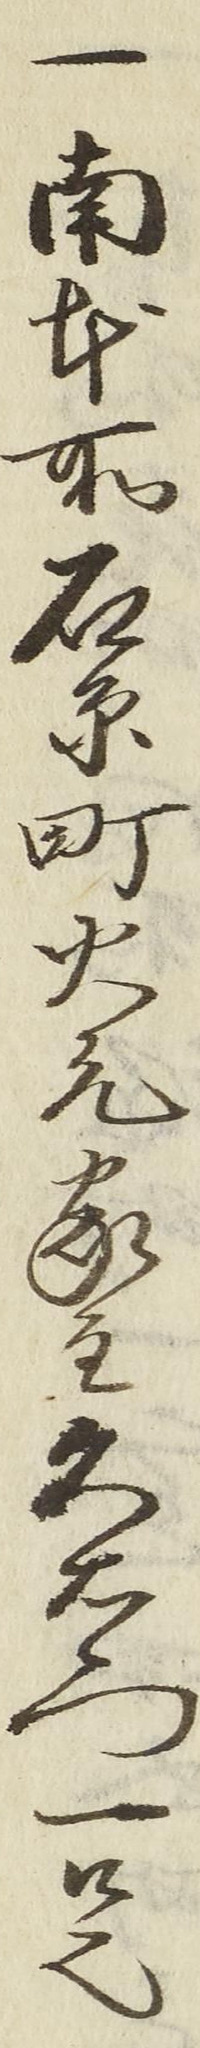一南本所石原町火元家主久右衛門一口也
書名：やぶれ窓の記　全
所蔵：東京大学地震研究所図書室 Earthquake Research Institute Library, The University of Tokyo, JAPAN
